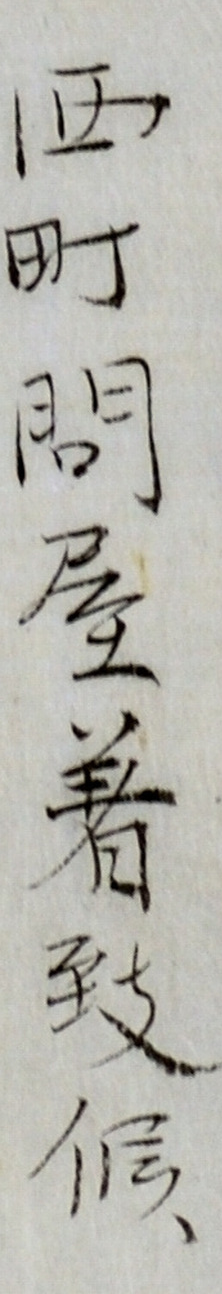西町問屋着致候
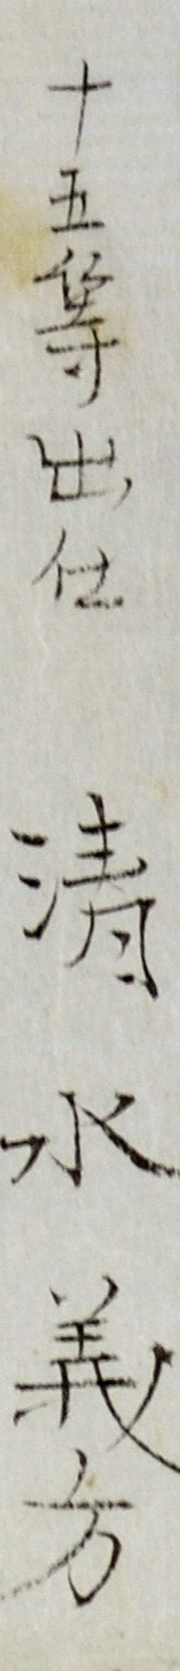十五等出仕清水義方
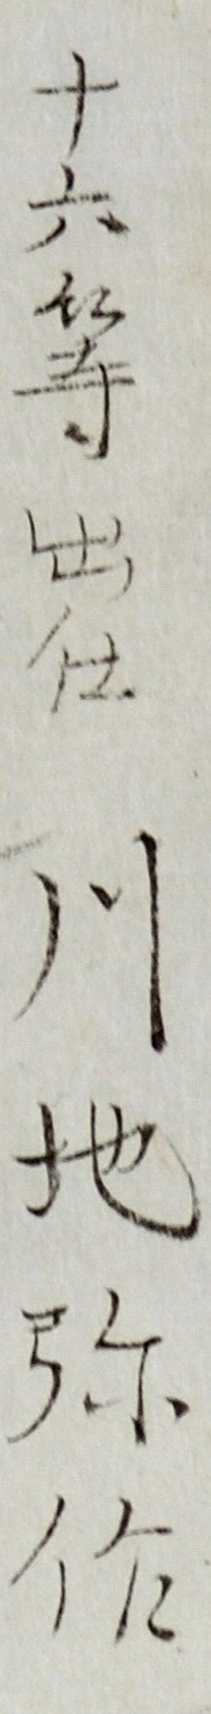十六等出仕川地弥作
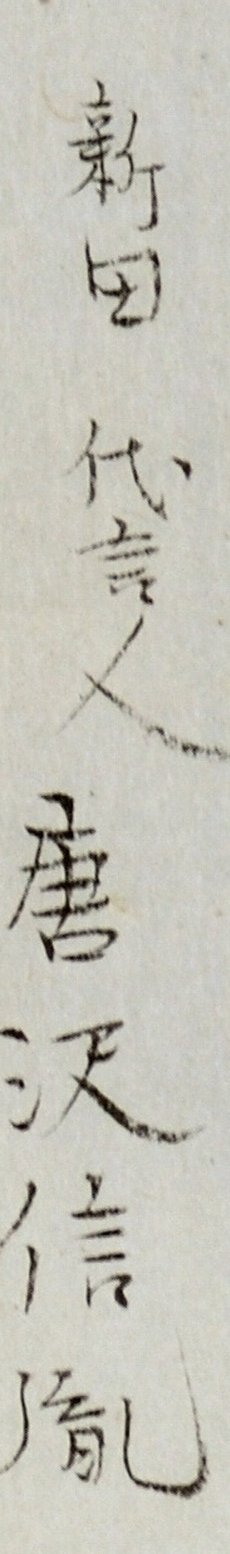新田代言人唐沢信胤
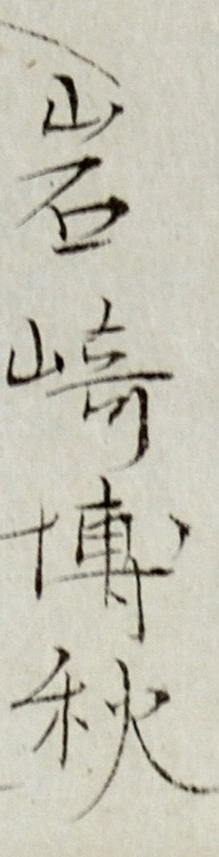岩崎博秋
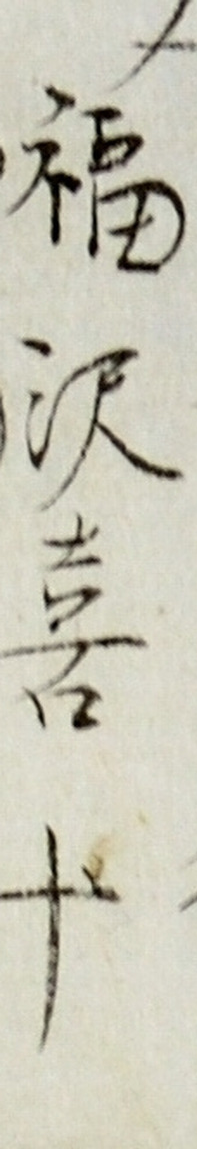福沢喜十
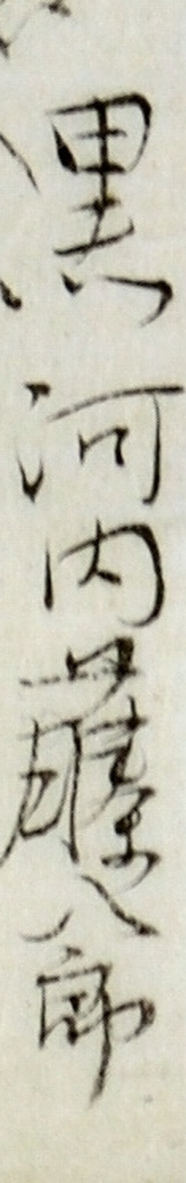黒河内藤八郎
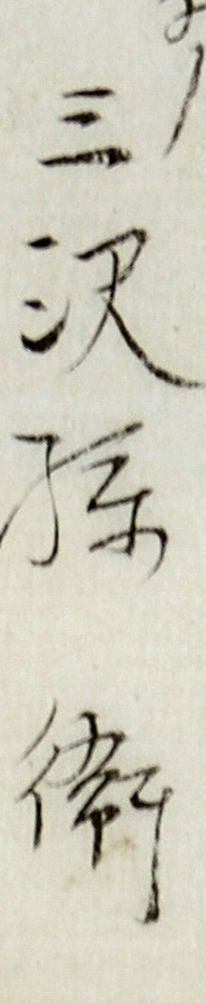三沢孫衛
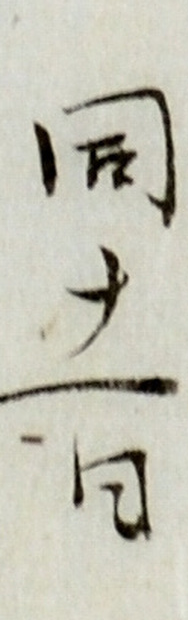同十一日
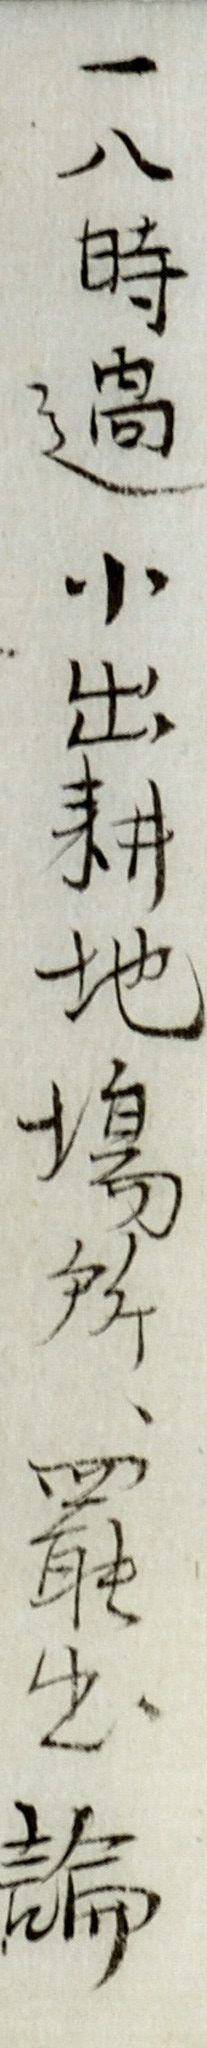一八時過小出耕地場所、罷出論
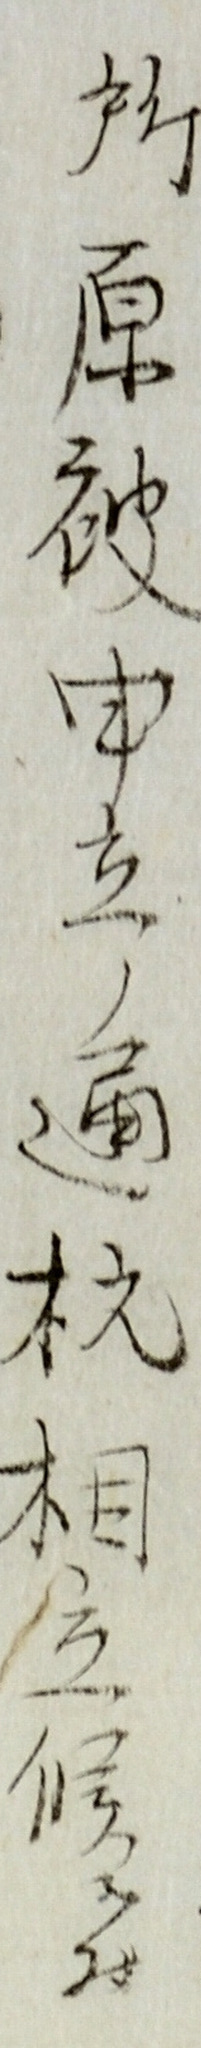所原被申立ノ通杭相立候付
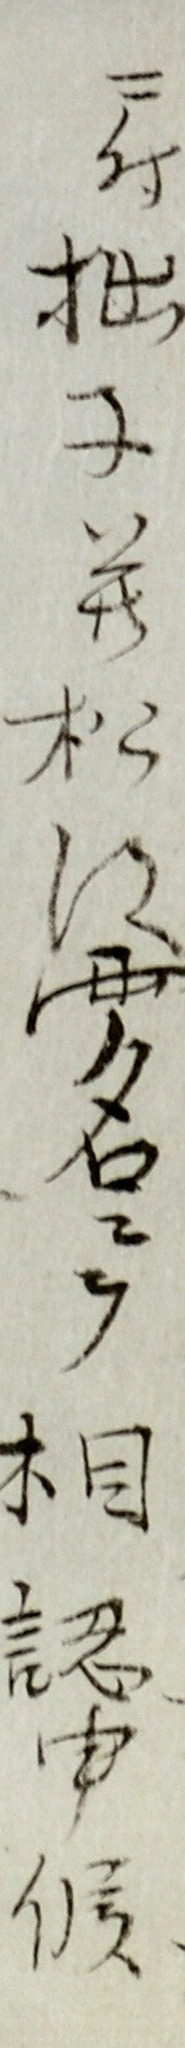ニ付拙子幷松沢両名ニテ相認申候
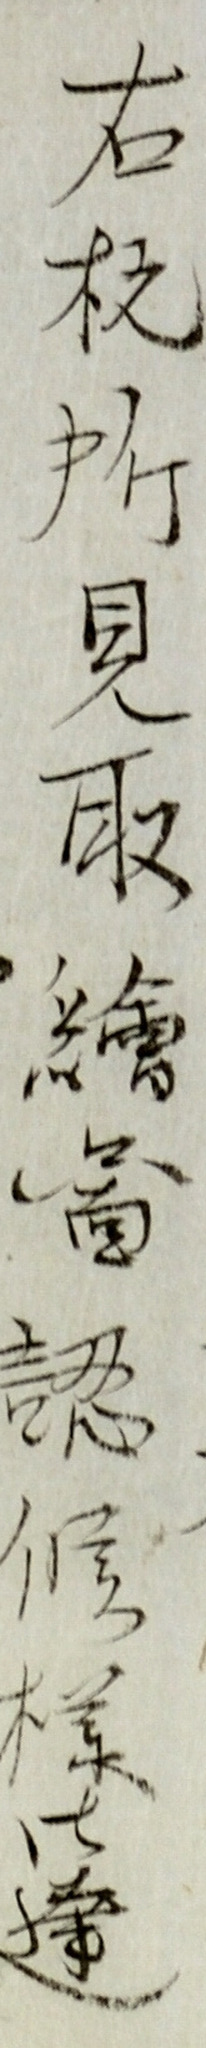右杭所見取絵図認候様御達
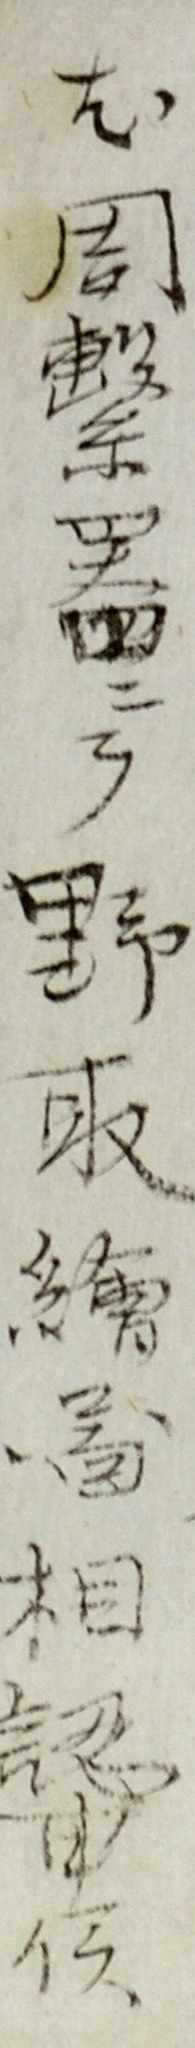尤周繋器ニテ野取絵図相認申候
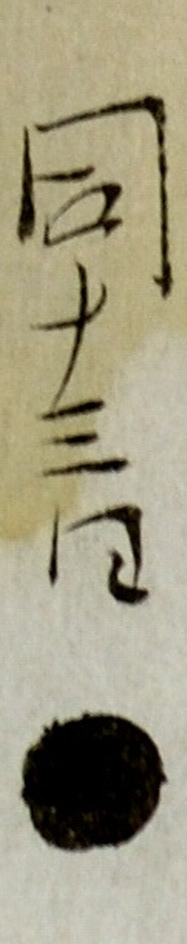同十三日●
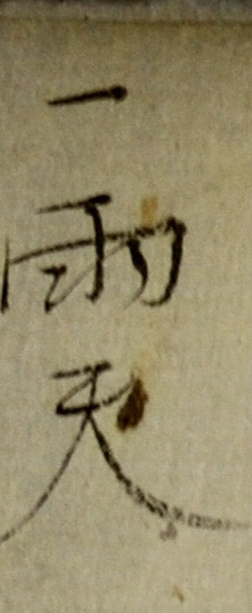一雨天
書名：小出耕地新田耕地山論測量控
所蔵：伊那市立高遠町図書館・合同会社AMANE
